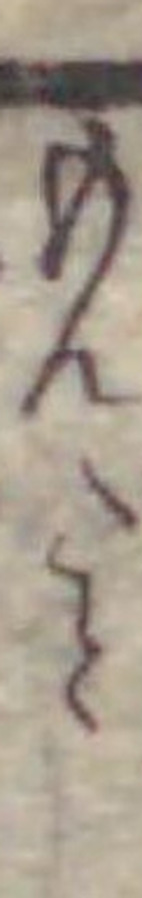もんだと
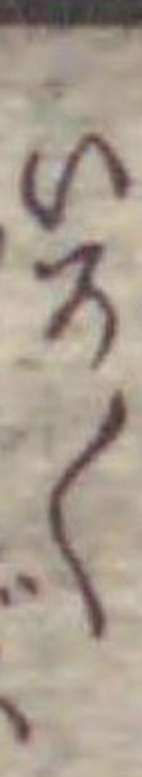いろ〳〵
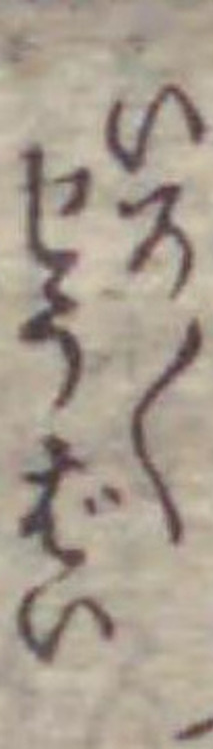せうばい
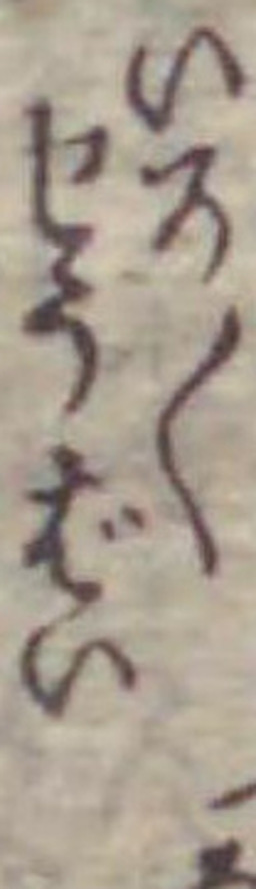せうばい
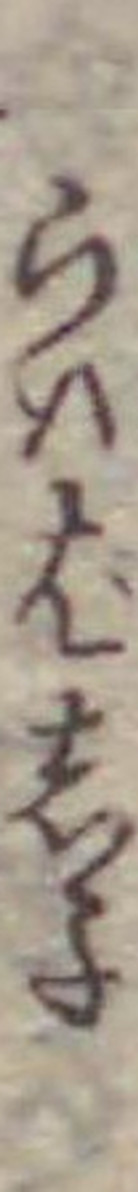らはばしよ
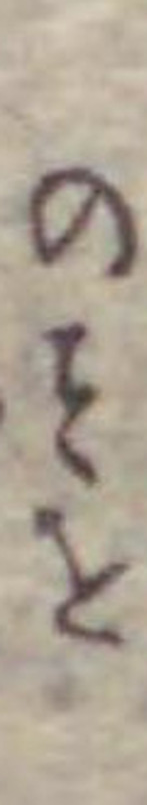のことを
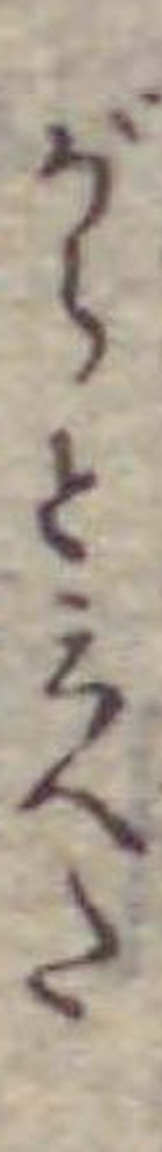がらとみへた
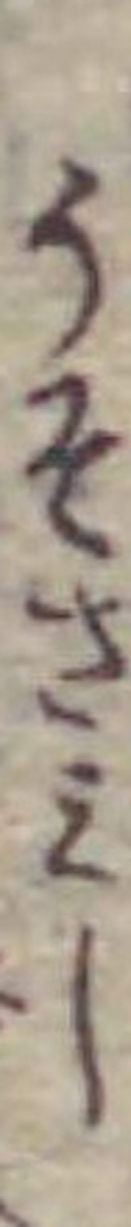うそさみし
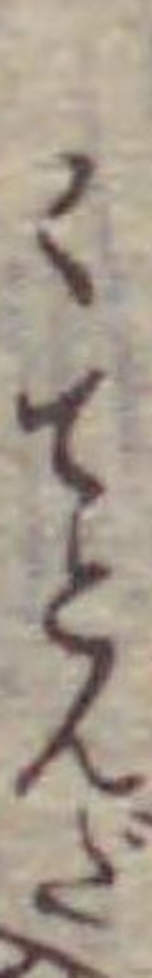くてとんだ
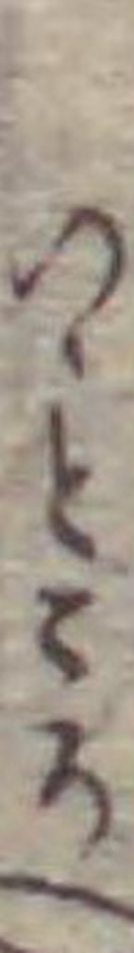いゝところ
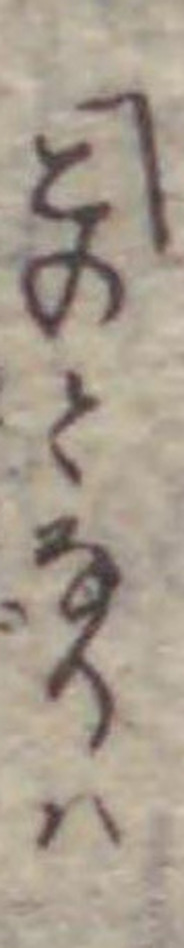〽このとなりは
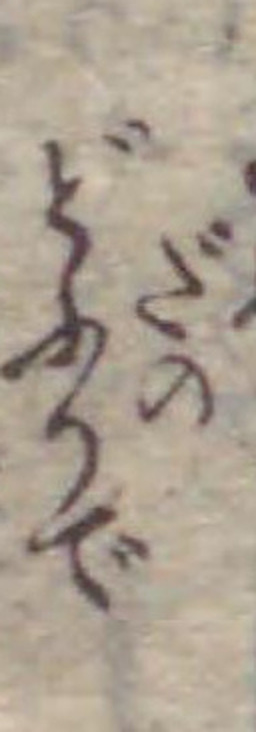どふりで
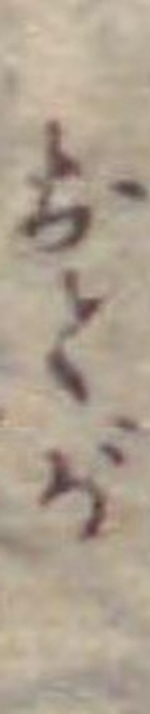おとが

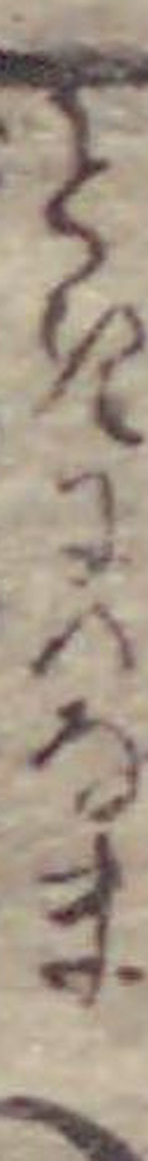ときにはなま
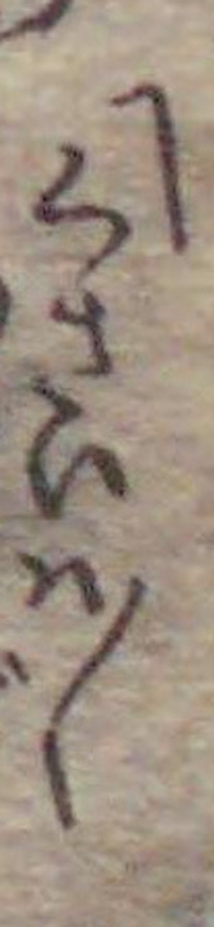〽くさいは〳〵
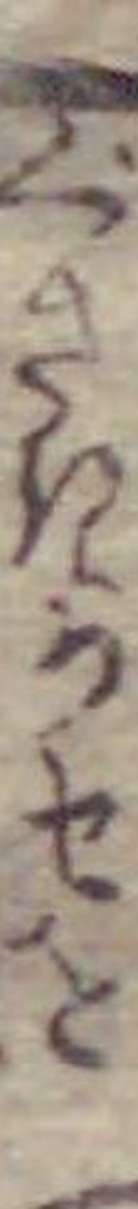ぐさきかせを
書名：化物見世開 : 2巻
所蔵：国立国会図書館 National Diet Library, JAPAN
